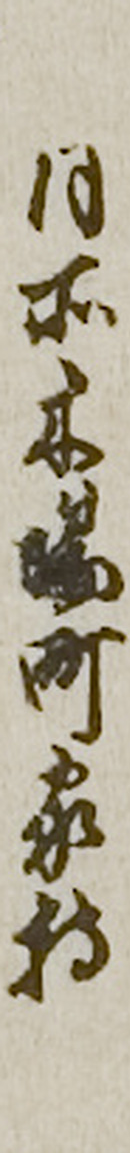同所木場町家持
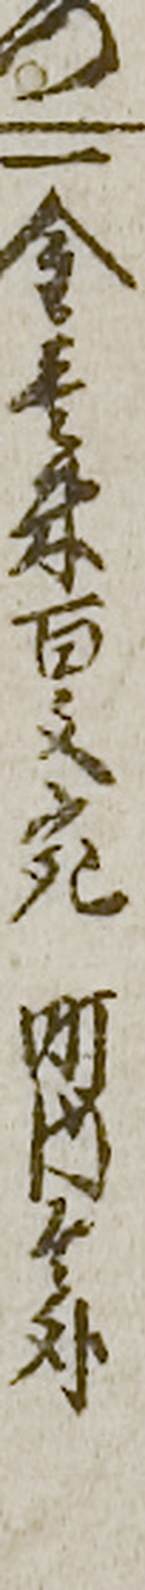一金壱朱百文宛町内其外
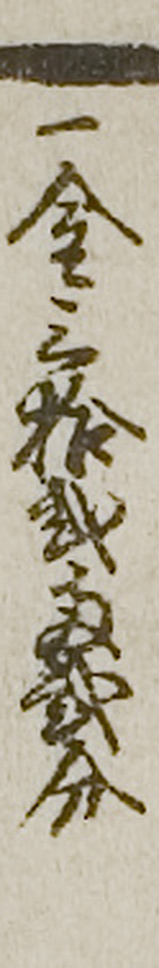一金三十五両弐分
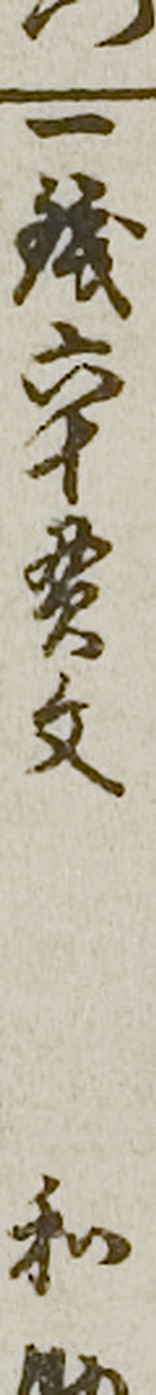一銭六十貫文和助
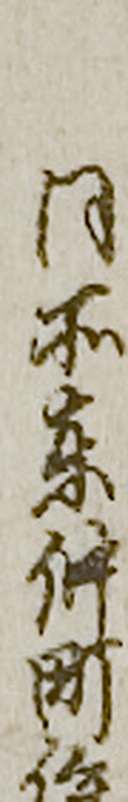同所東仲町
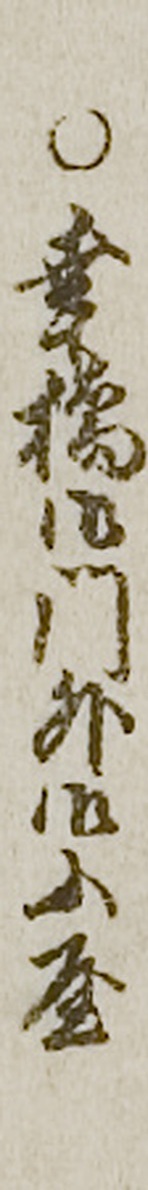○幸橋御門外御小屋
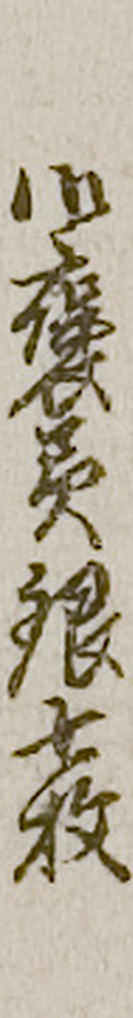御褒美銀七枚
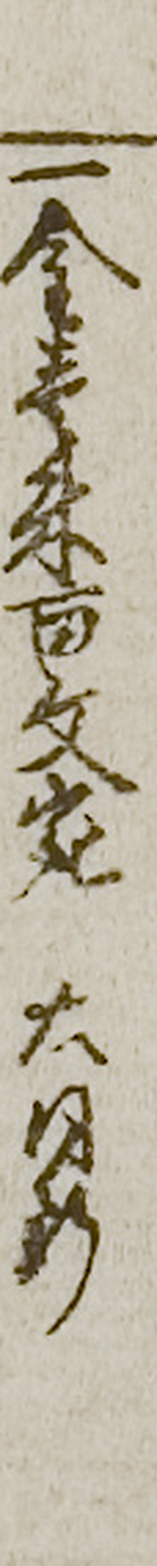一金壱朱百文宛右同断
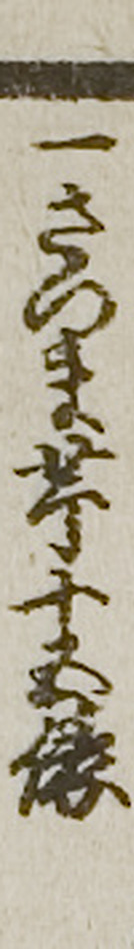一さつま芋十俵
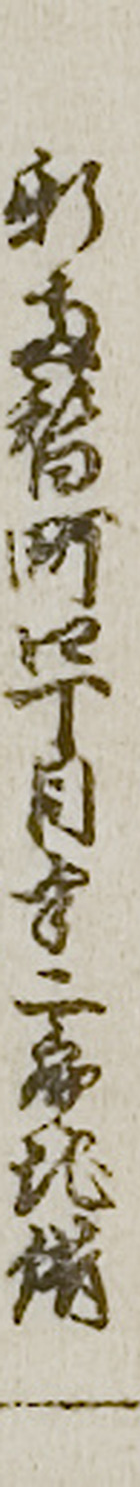新両替町四丁目半二郎地借
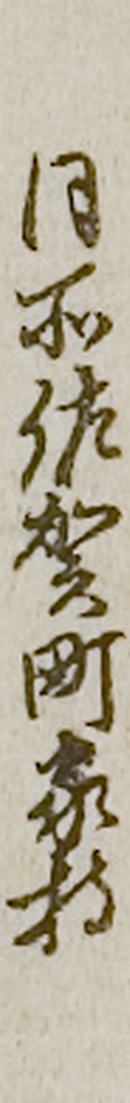同所佐賀町家持
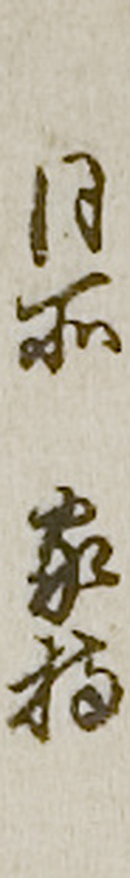同所家持
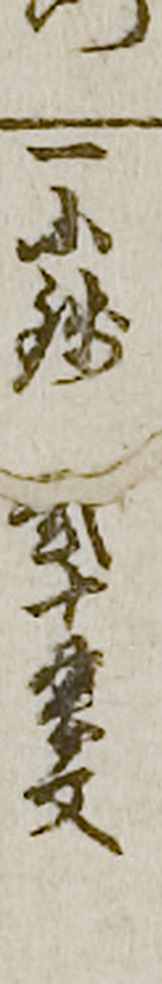一小銭弐十貫文
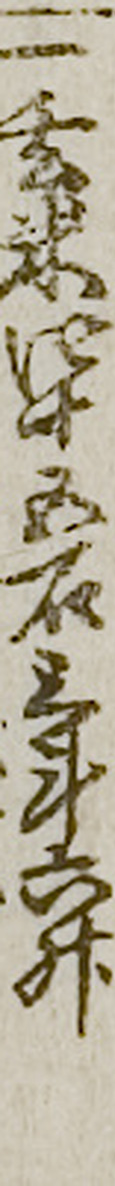一玄米四十五石三斗六升
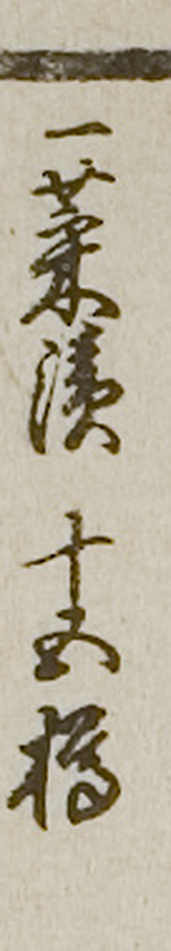一菜漬一樽
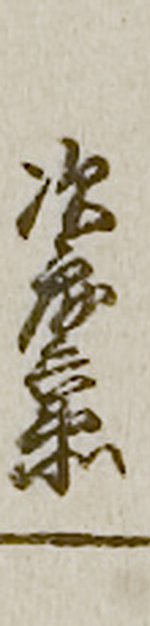十郎兵衛
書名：地震出火御救小屋施行名前附
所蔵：東京大学総合図書館 General Library in the University of Tokyo, JAPAN
